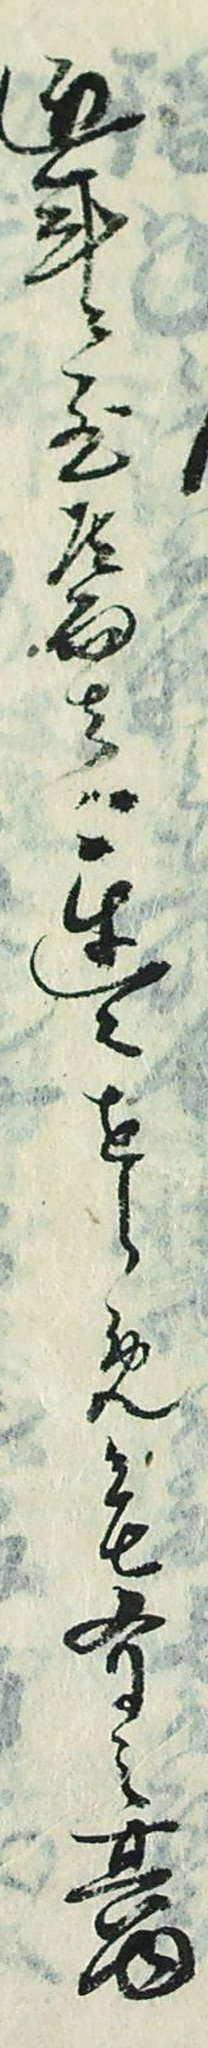近年ニ至候而者遅々せしめ候も有之其内
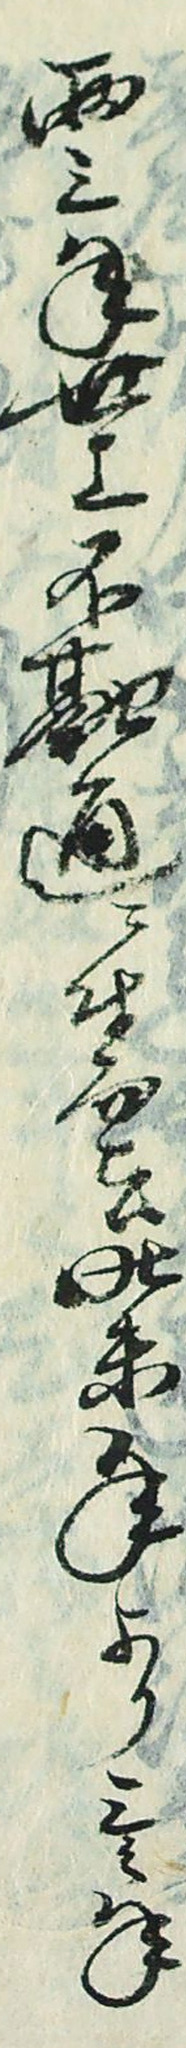両三年世上不融通ニ付而者昨未年より三ケ年
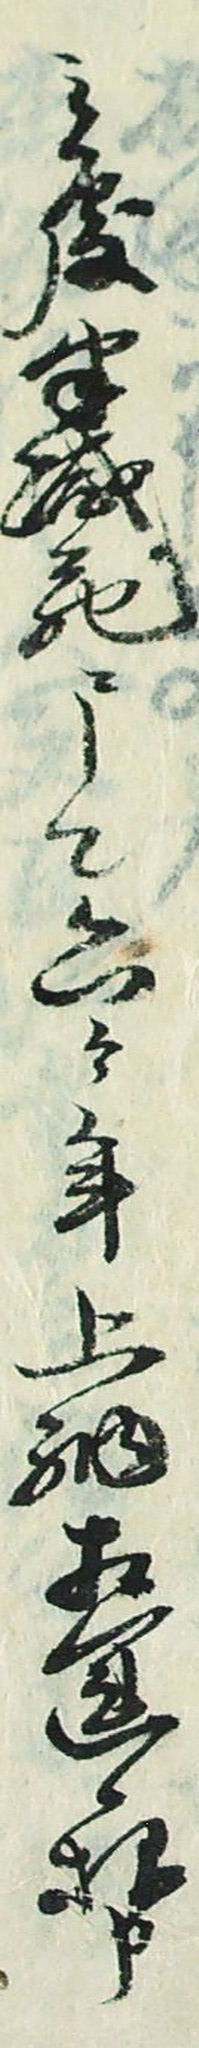之處半減宛ニして六ケ年上納相運候様申
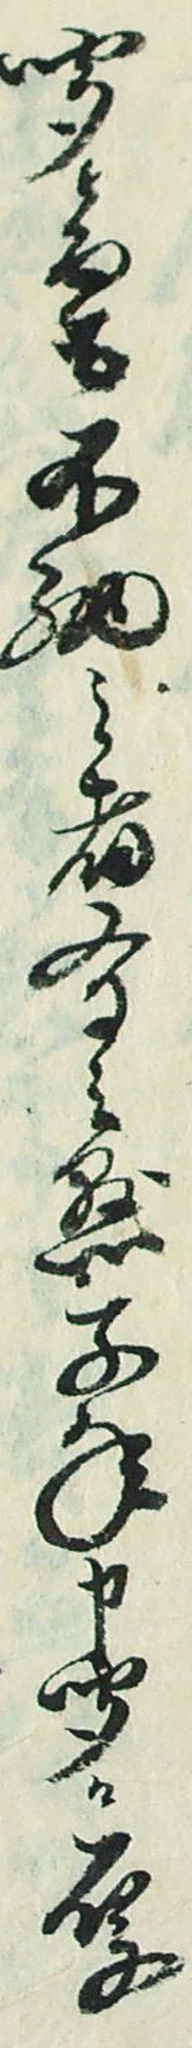聞と而も不納之者有之懸子年申聞候厚
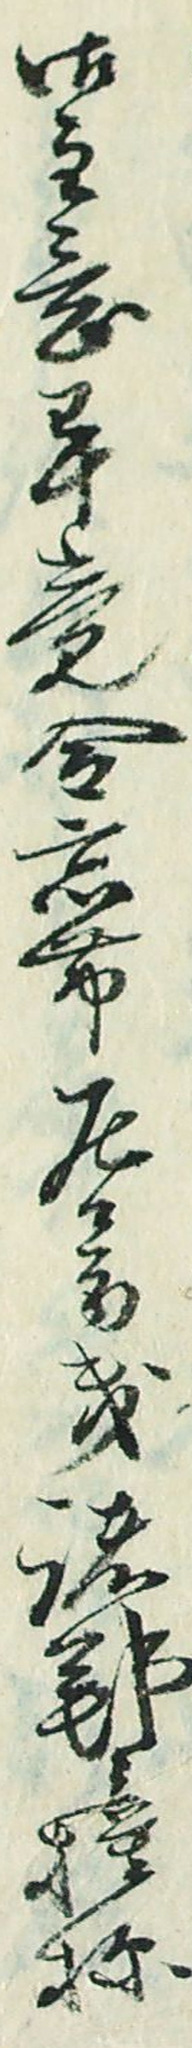御主意畢竟令忘帯居候旨義諸郡之模様

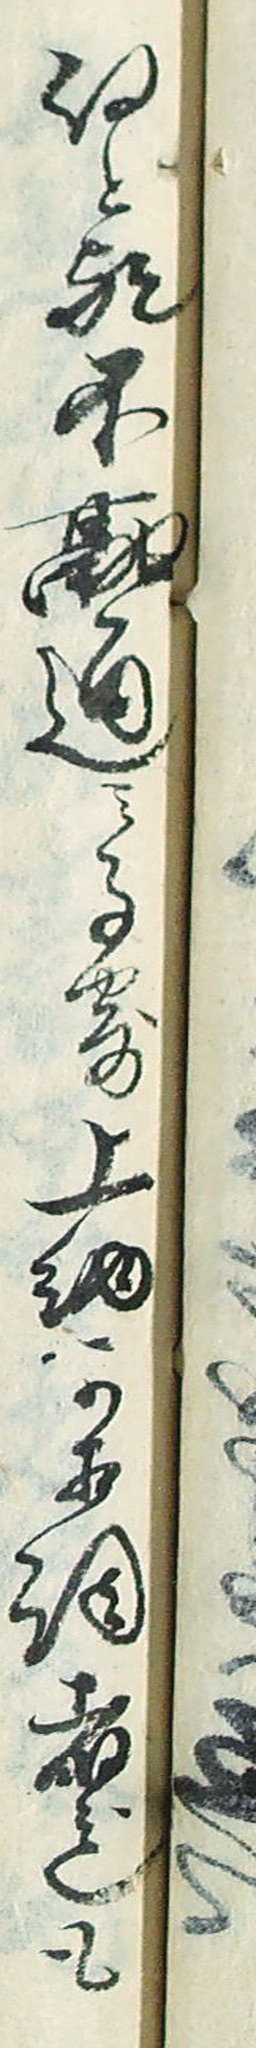何と欤不融通之事寄上納可相調者迄も
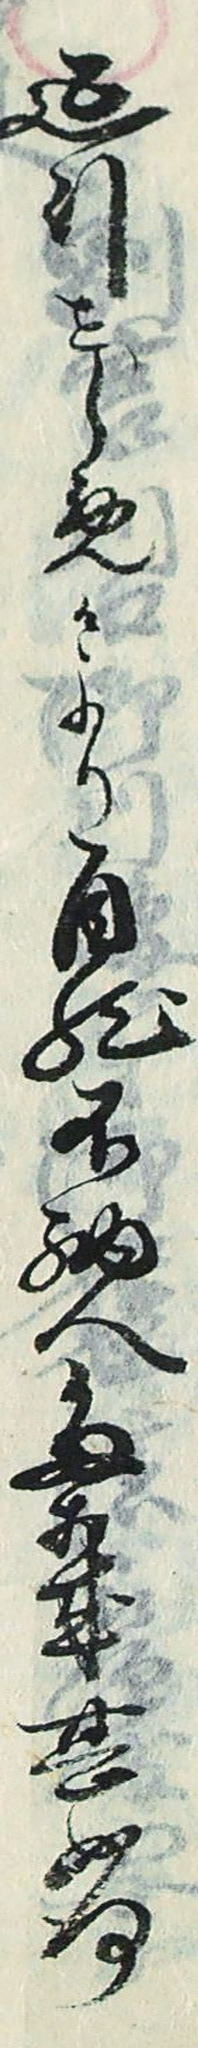延引せしめ候より自然不納人多相成甚如何
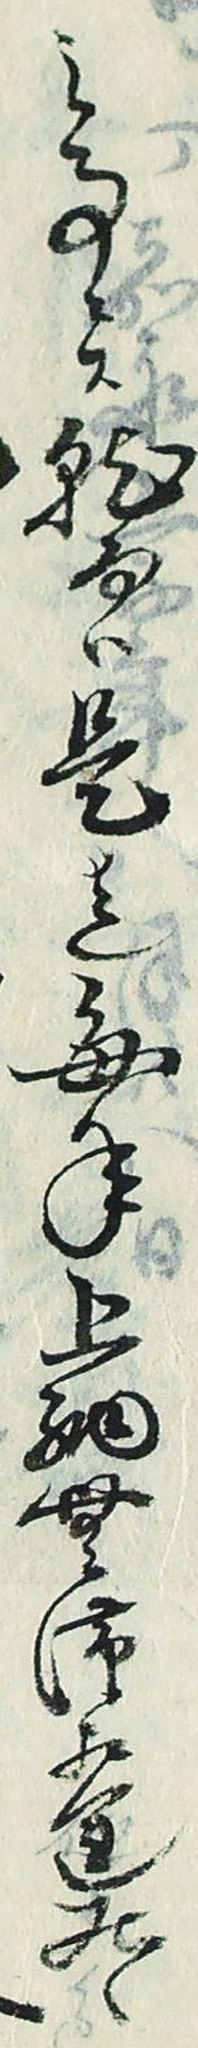之事ニ候就而ハ是迄毎年上納無滞相運居候
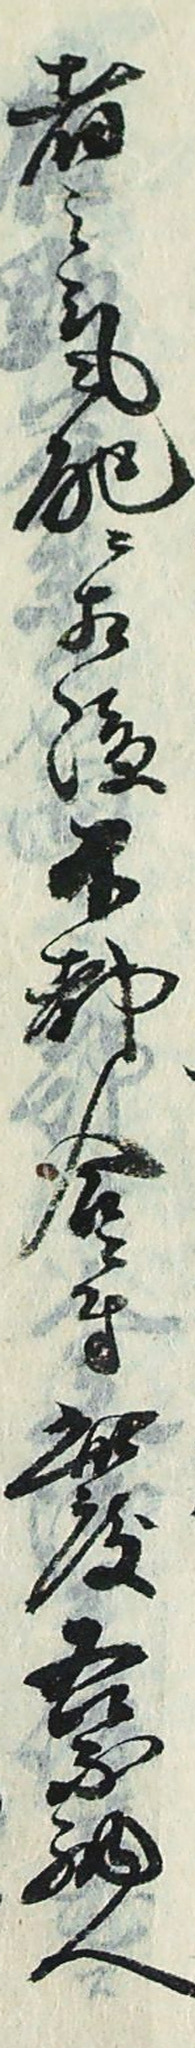者之気配ニ相障不都合ニ付此度右不納人
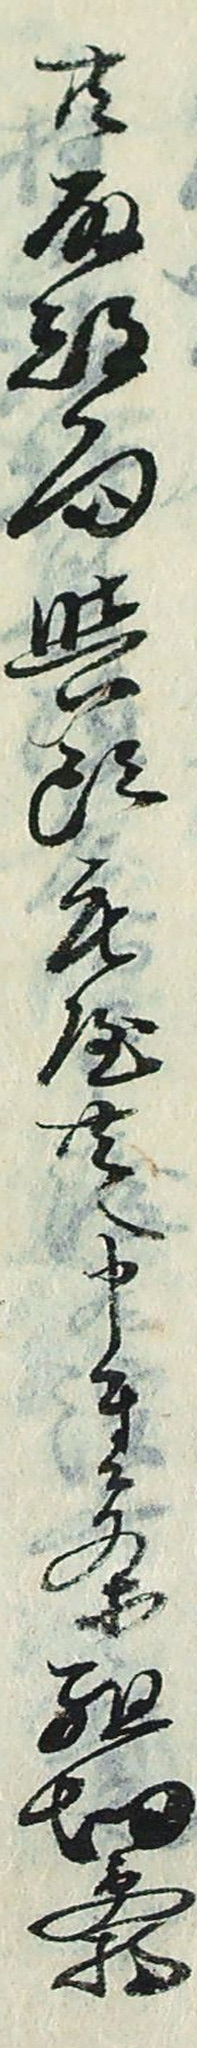共取都向與頭庄屋共へ申付候条組切受持
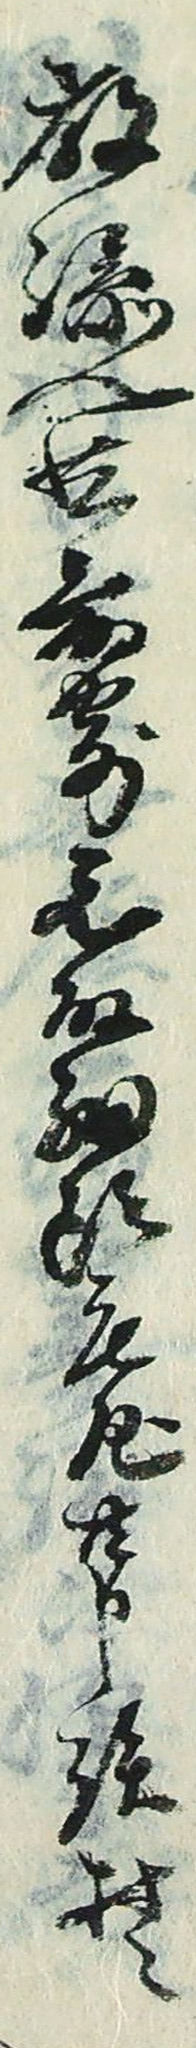教諭人共最寄元取組頭庄屋共申談村々
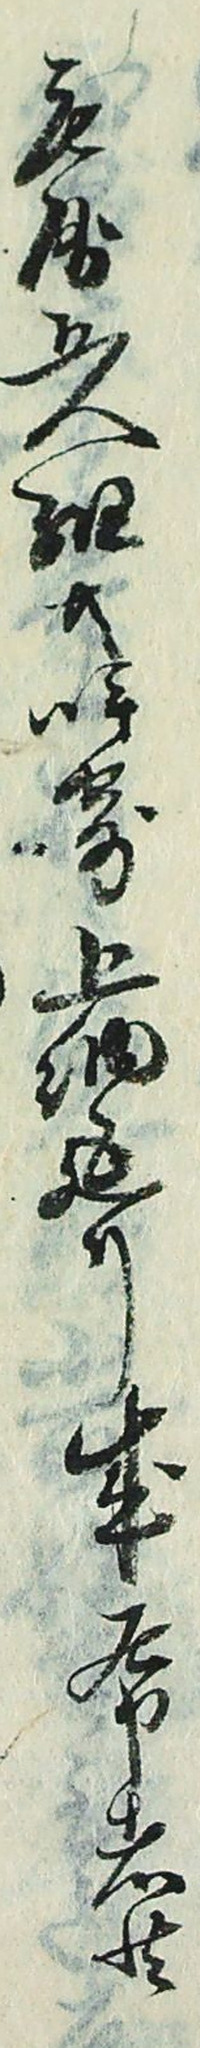庄屋五人組共呼寄上納延引成居申者共
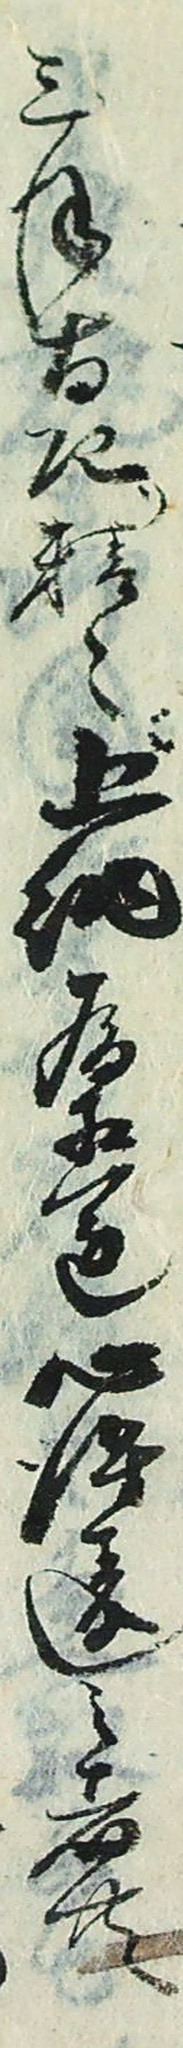三月十日限り精々上納為相運心得違之者共
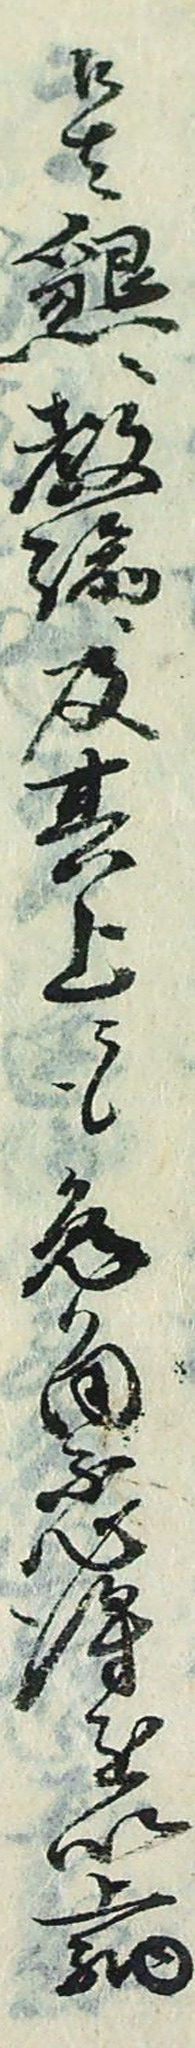江者懇ニ教諭ニ及其上ニも兎角不心得を以上納
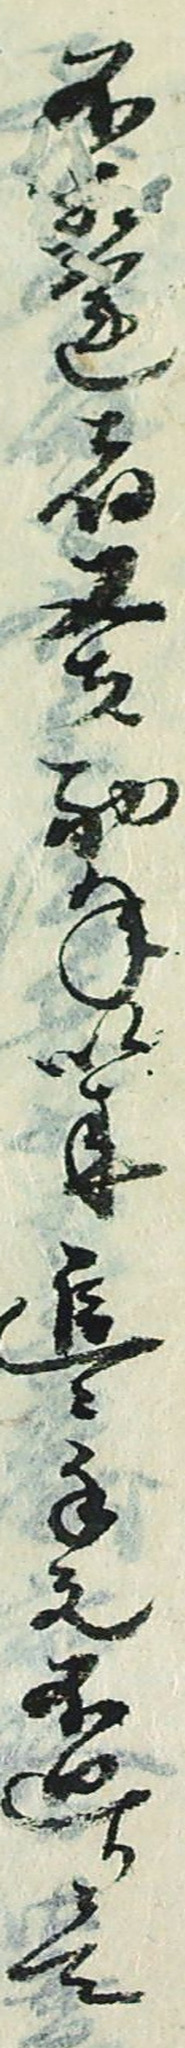不相運者又者初年以来追々手元不廻りニて
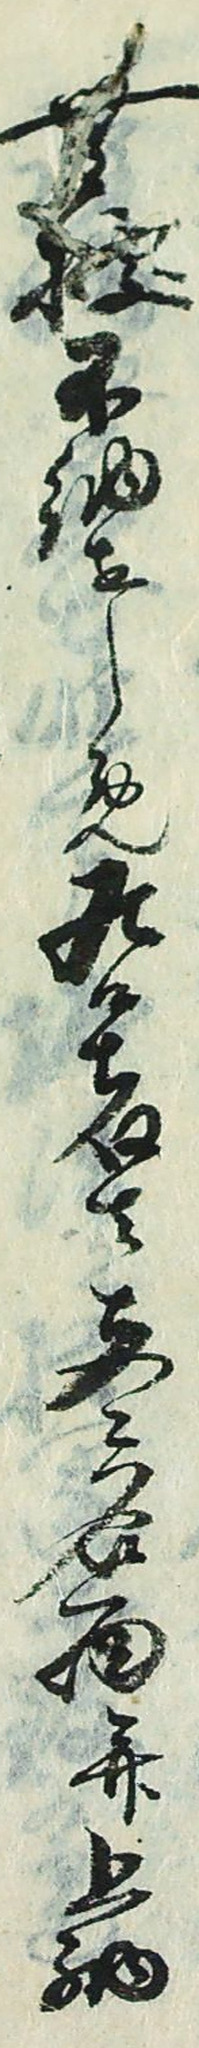無據不納せしめ居候者は夫々名面幷上納
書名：諸御趣意書并御下知向之写
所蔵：鳴門教育大学 Naruto University of Education
